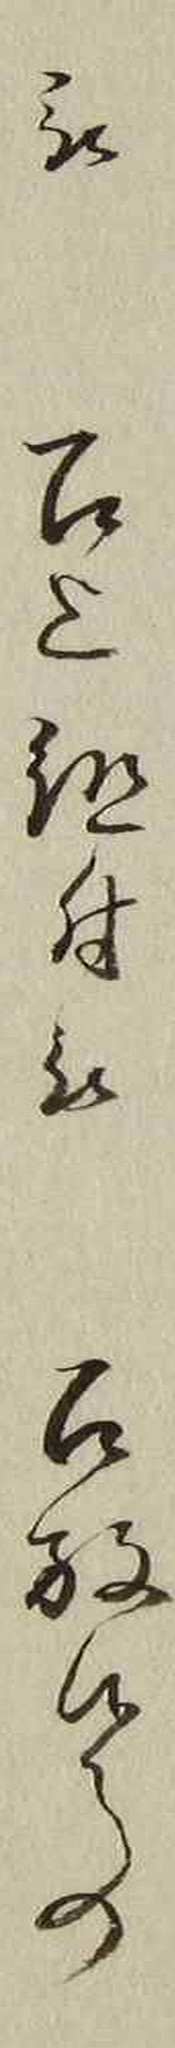被召上組付被召放候事
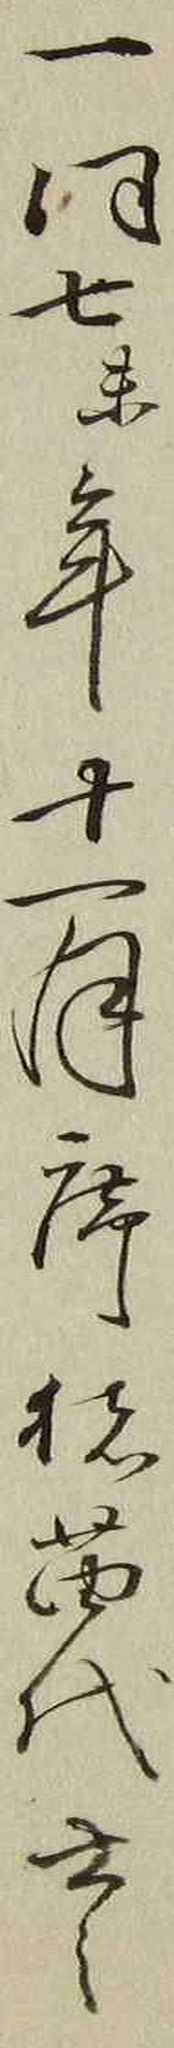一同七未年十一月席猪苗代士之
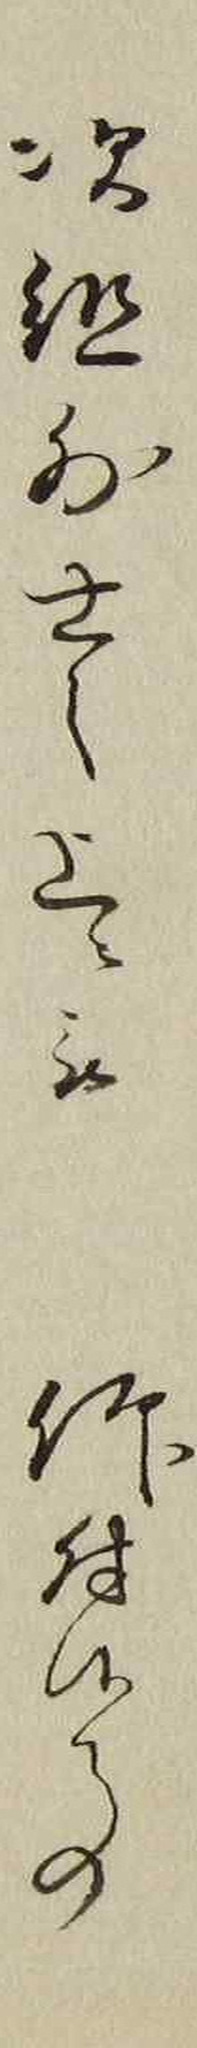次組外士之上ニ被仰付候事
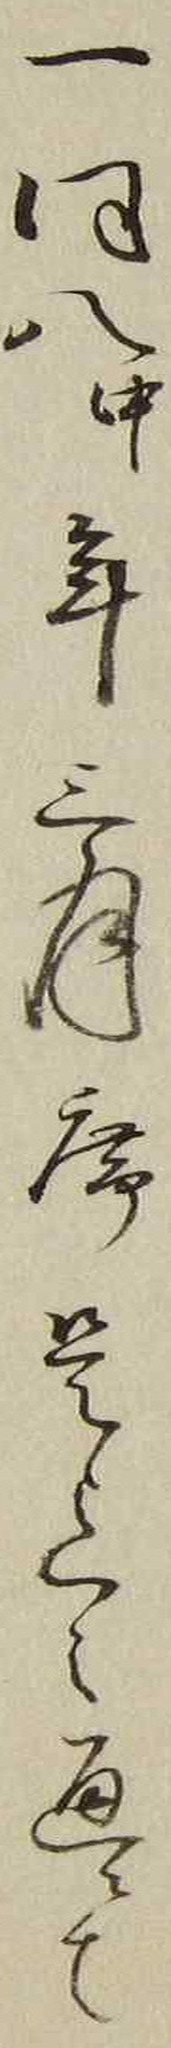一同八申年三月席是迄之通ニて
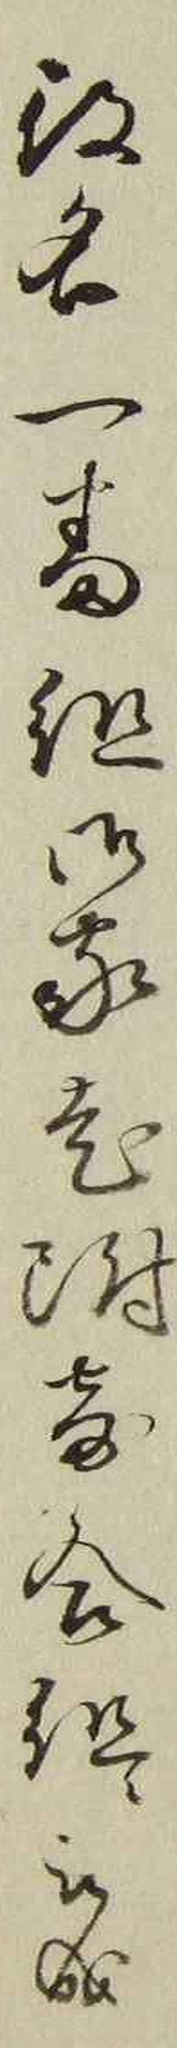役名一番組御家老附寄合組ニ被成

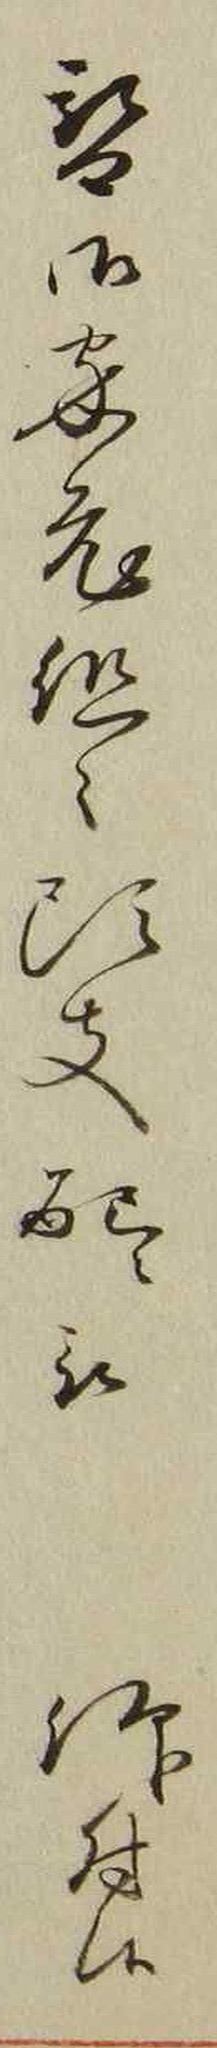替御家老組之頭支配ニ被仰付候
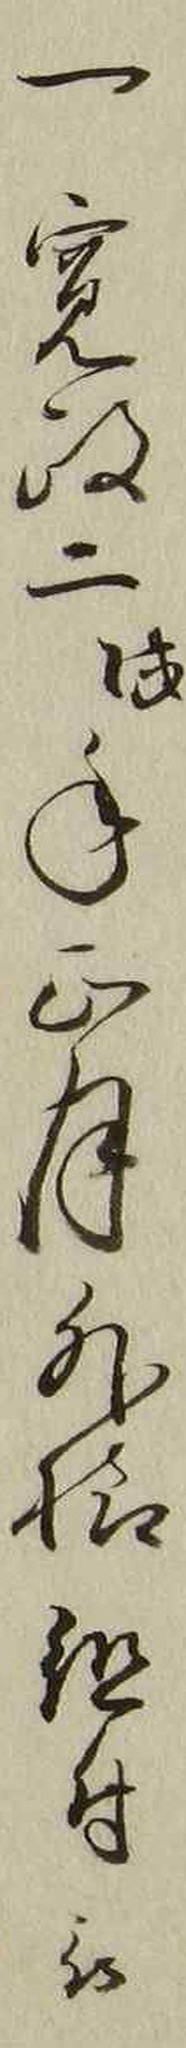一寛政二戌年正月外様組付被
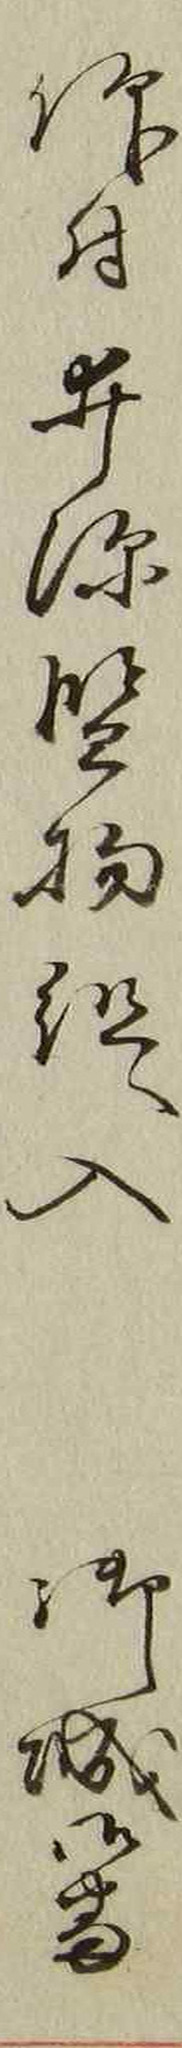仰付井深監物組へ入御城御番
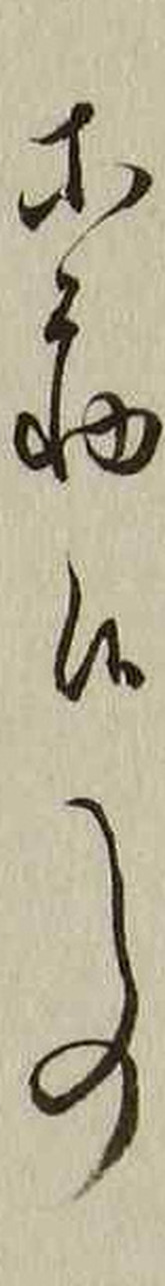相勤候事
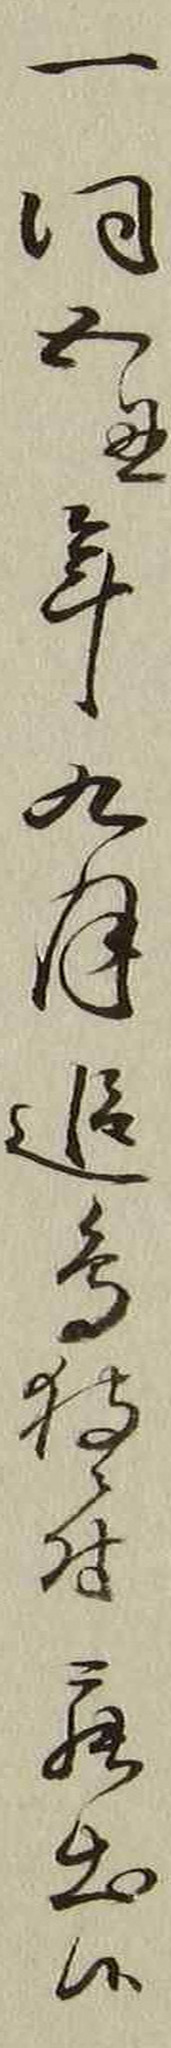一同五丑年九月追鳥狩ニ付罷出候
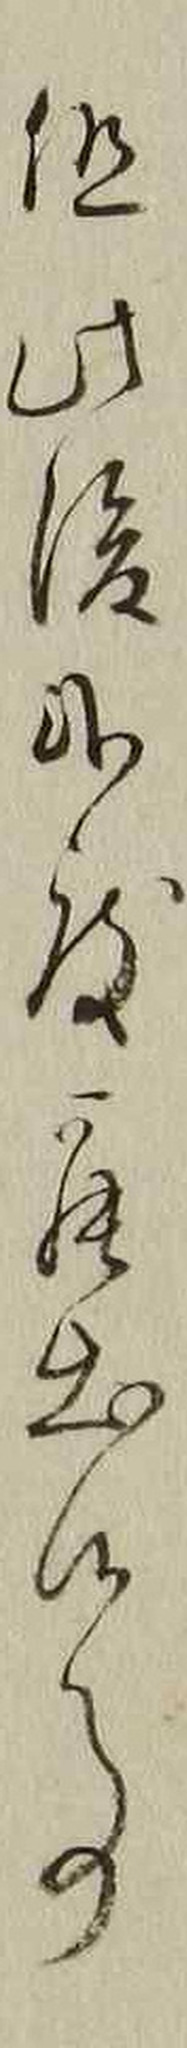但此後弐度罷出候事
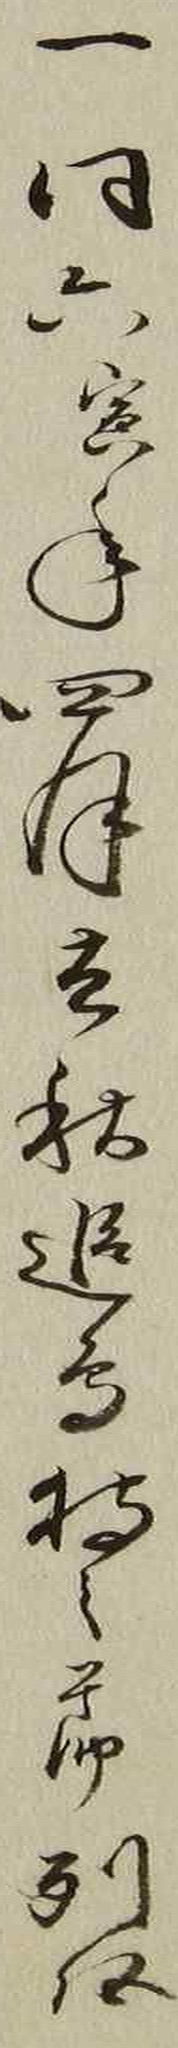一同六寅年四月去秋追鳥狩之節列伍
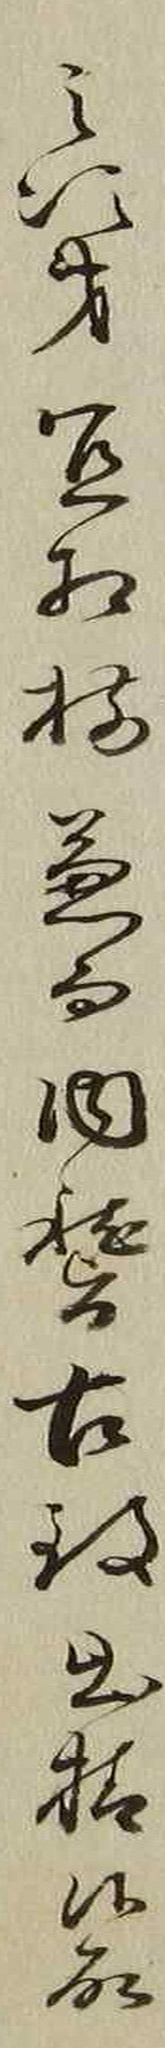之次第宜相揃兼而内稽古致出精候故
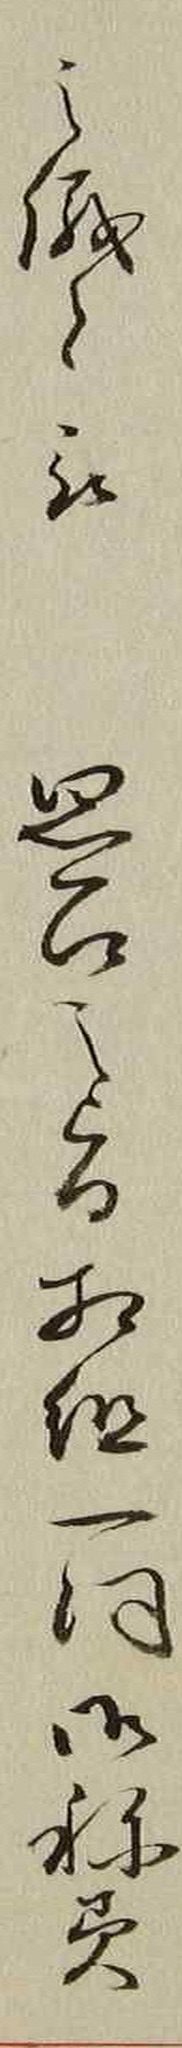之儀と被思召之旨相組一同御称美
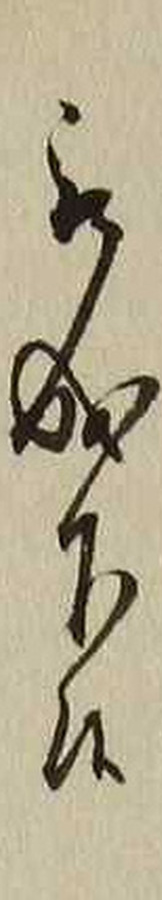被成下候
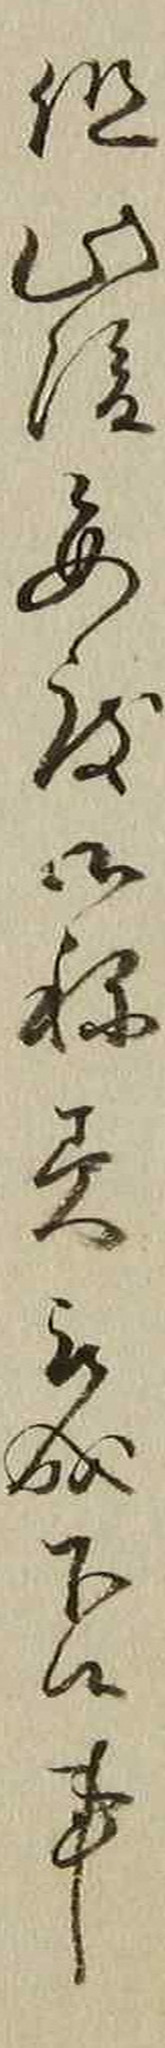但此後毎度御称美被成下候事
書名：諸士系譜　巻之4　い之部4
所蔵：会津若松市立会津図書館
